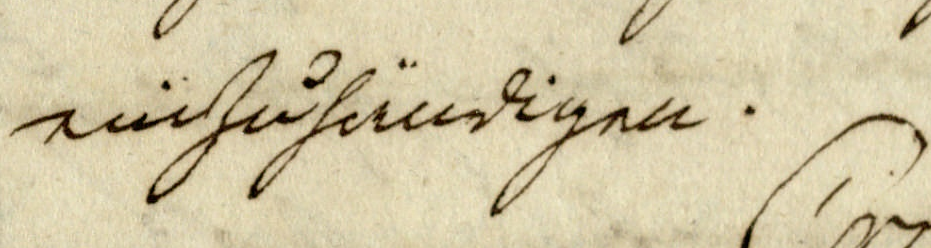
einzuhändigen.
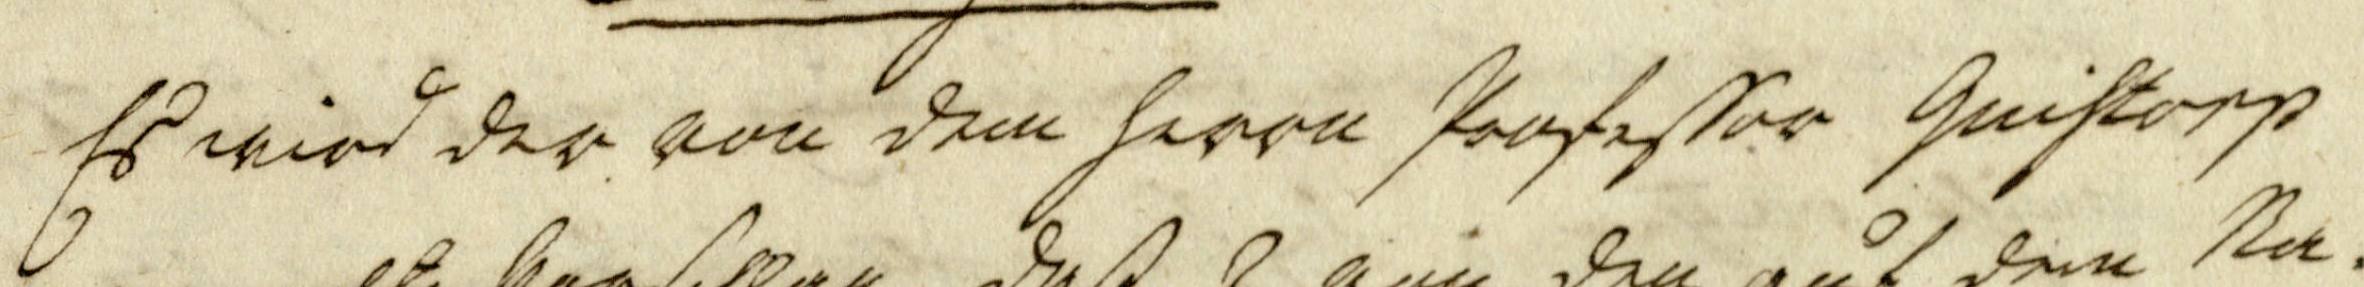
Es wird der von dem herrn Professor Quistorp
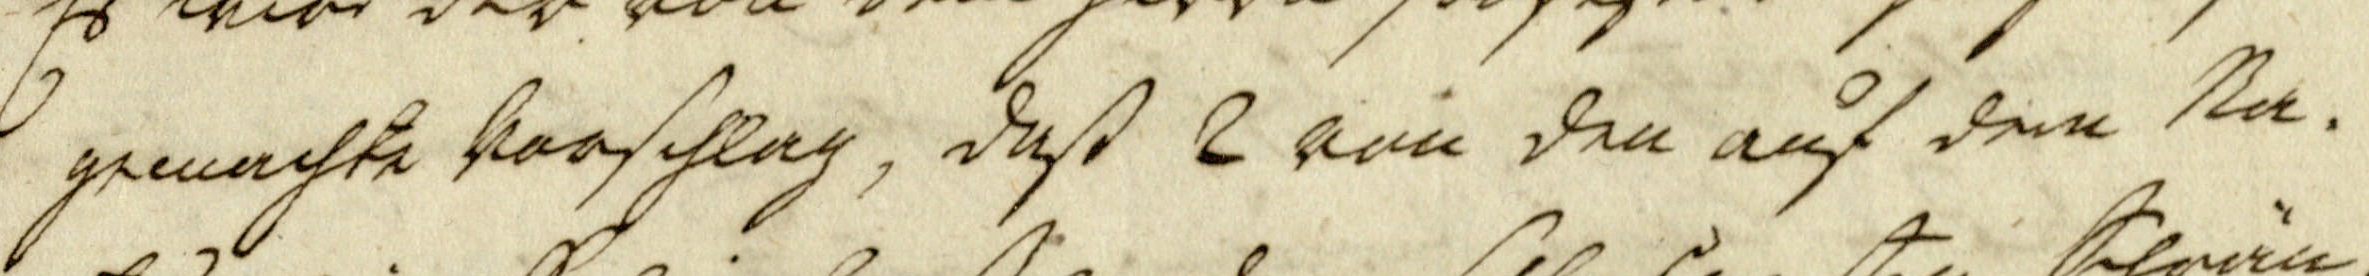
gemachte Vorschlag, daß 2 von den auf dem Na¬
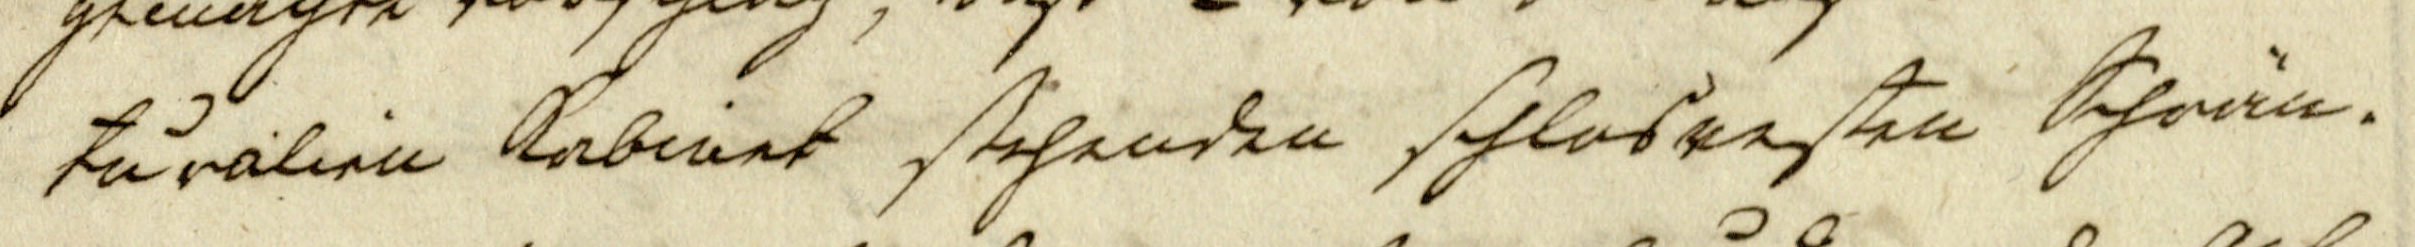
turalien Kabinet stehenden schlosvesten Schrän¬
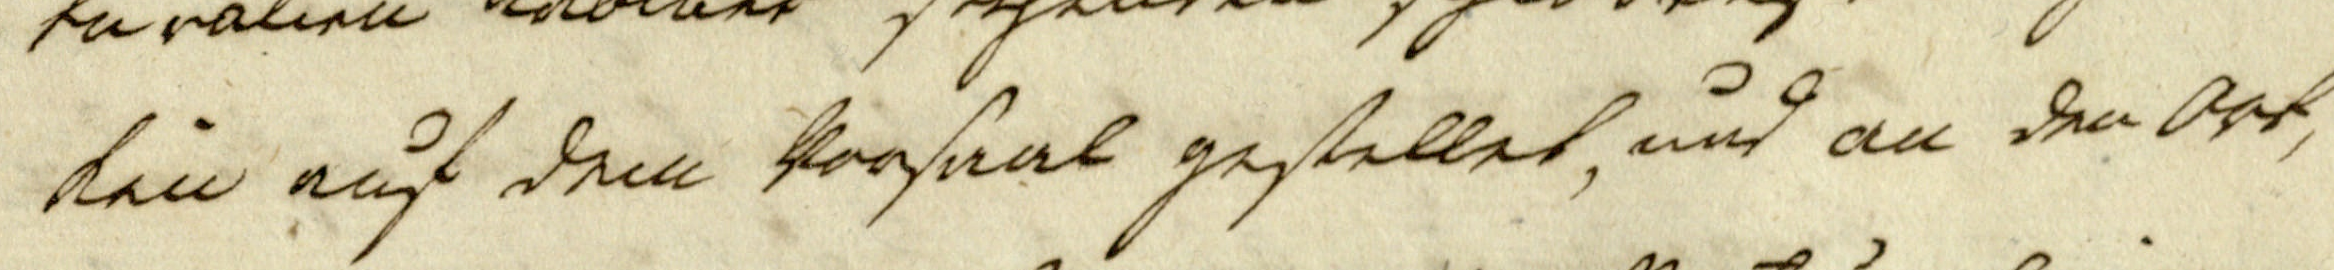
ken auf dem Vorsaal gestellet, und an den Ort,
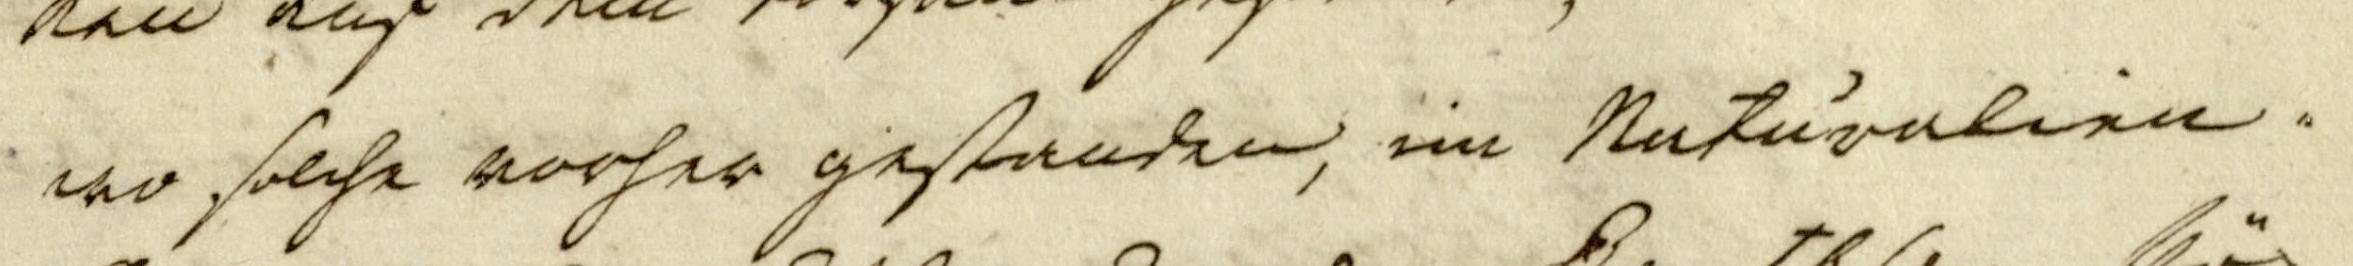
wo solche vorher gestanden, im Naturalien¬
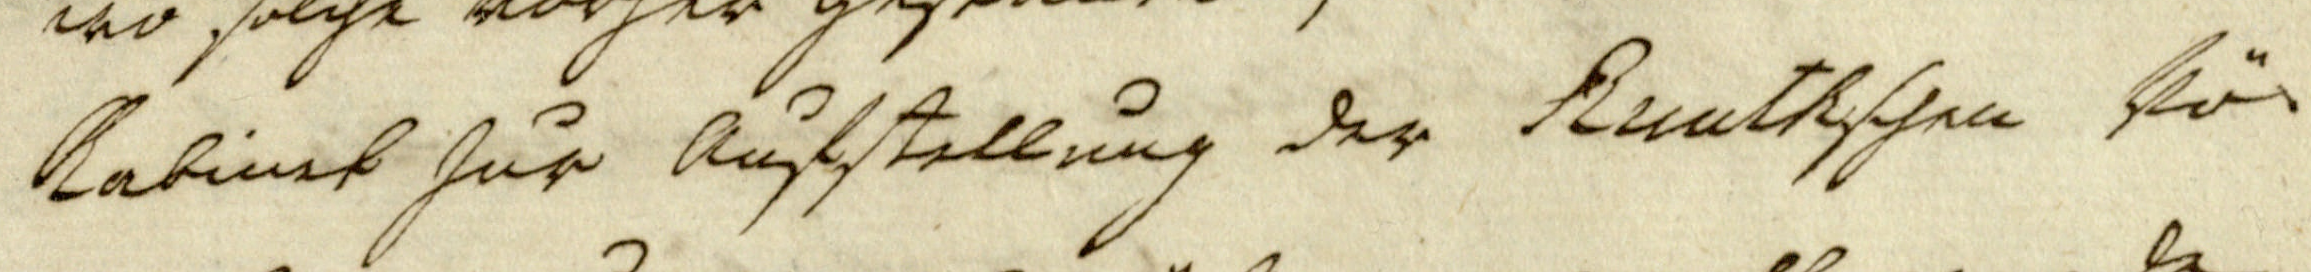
Kabinet zur Aufstellung der Ruuthschen Vö¬
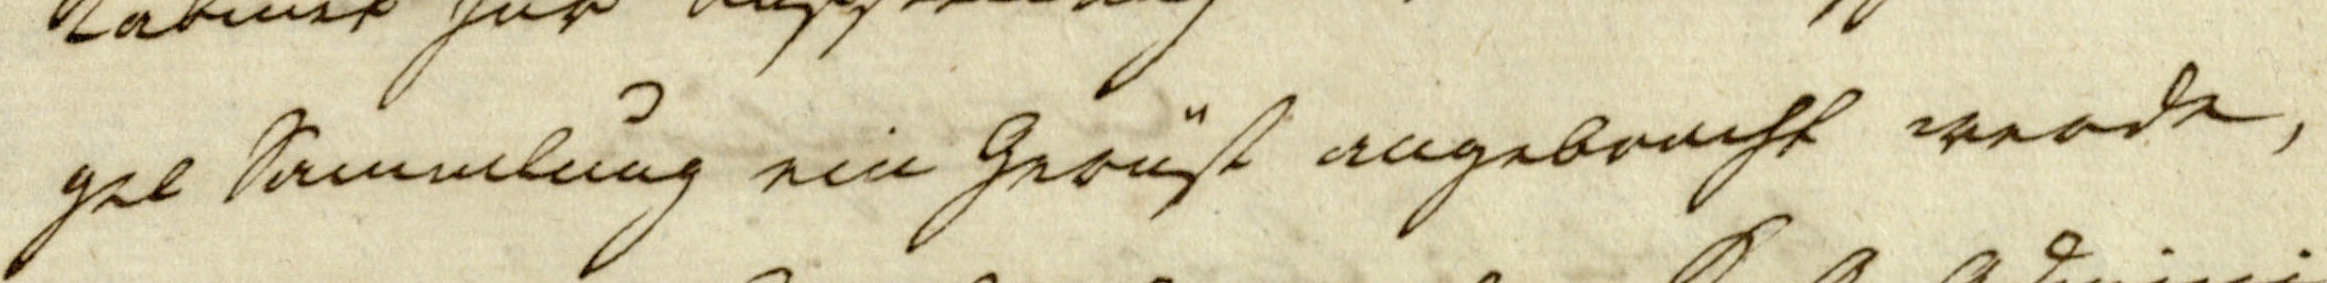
gel Sammlung ein Gerüst angebracht werde,
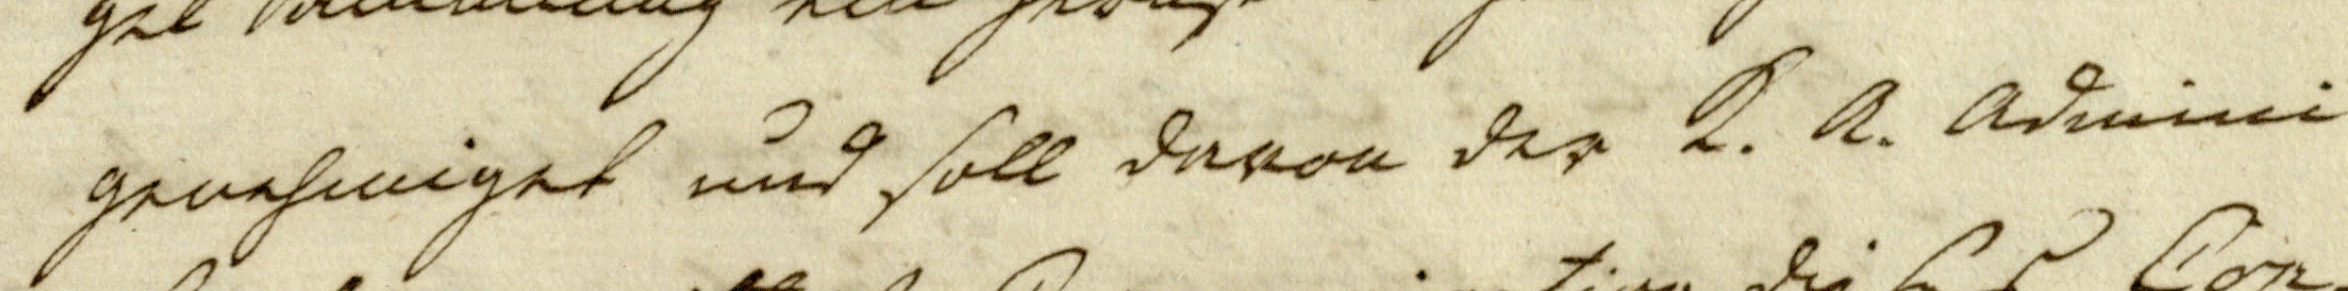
genehmiget und soll davon der K. A. Admini¬
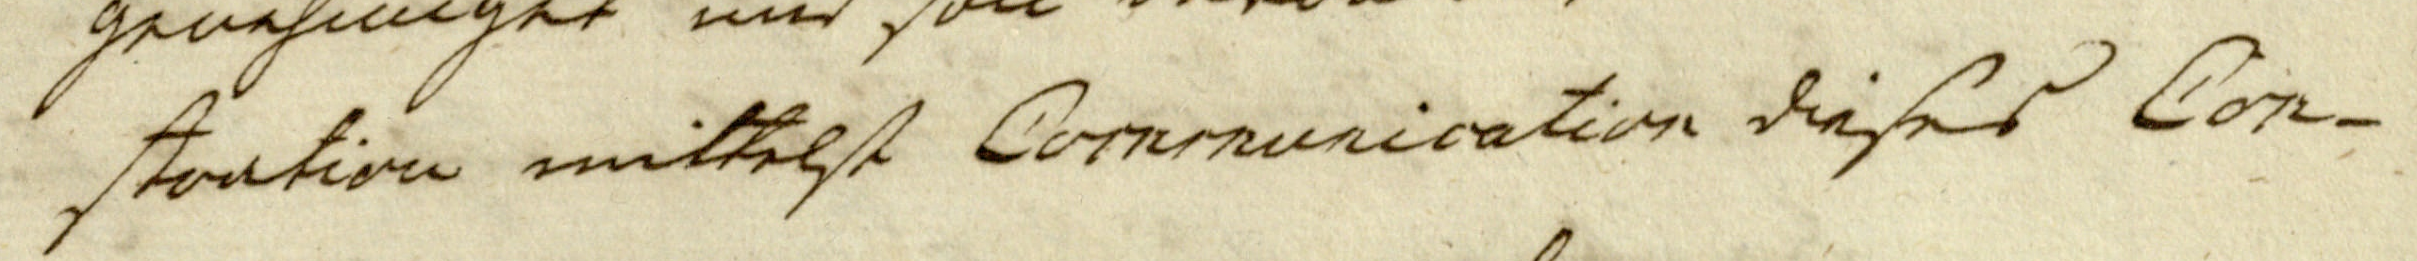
stration mittelst Communication dieses Con¬
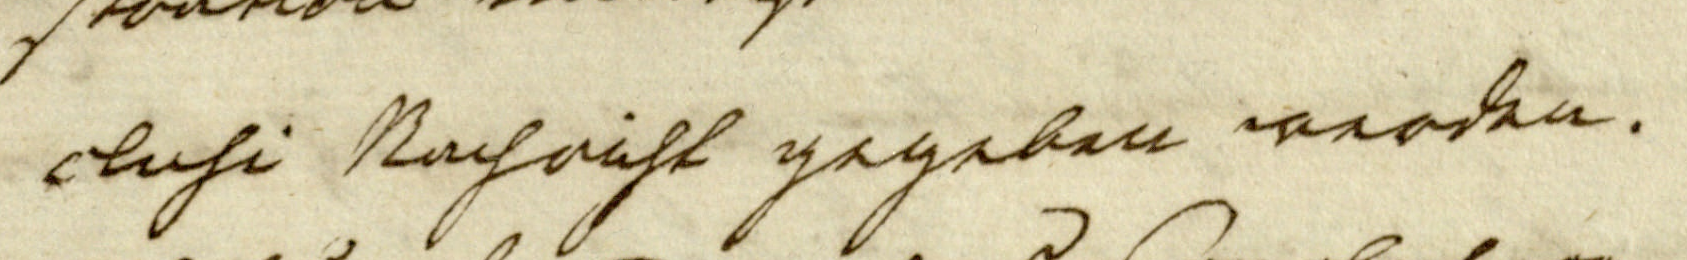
clusi Nachricht gegeben werden.
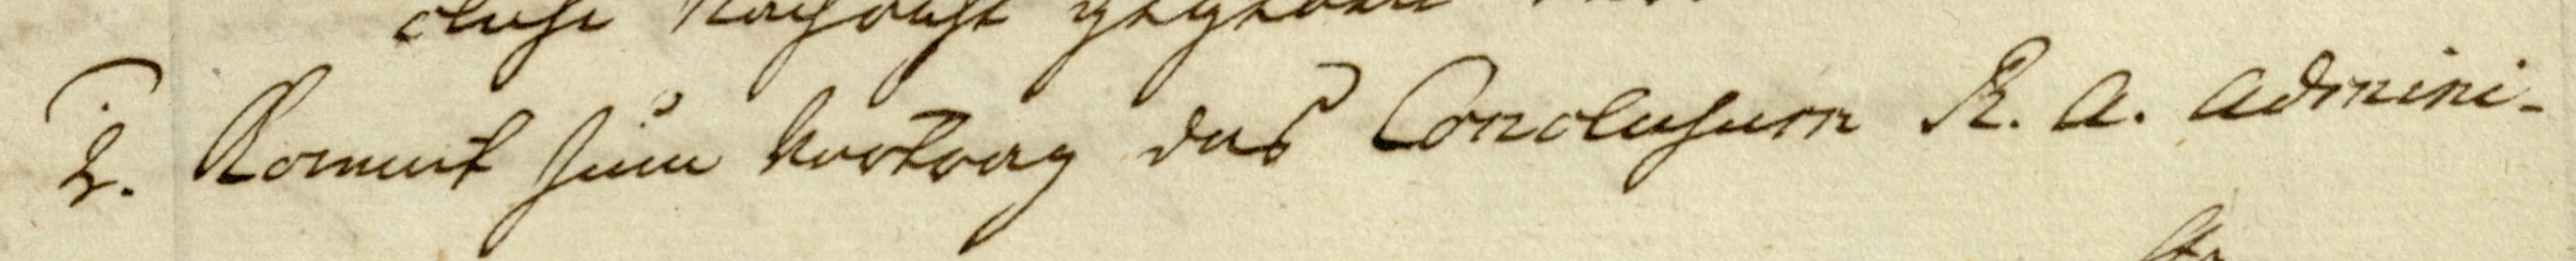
2., Kommt zum Vortrag das Conclusum K. A. Admini¬
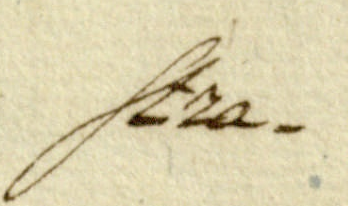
stra.
